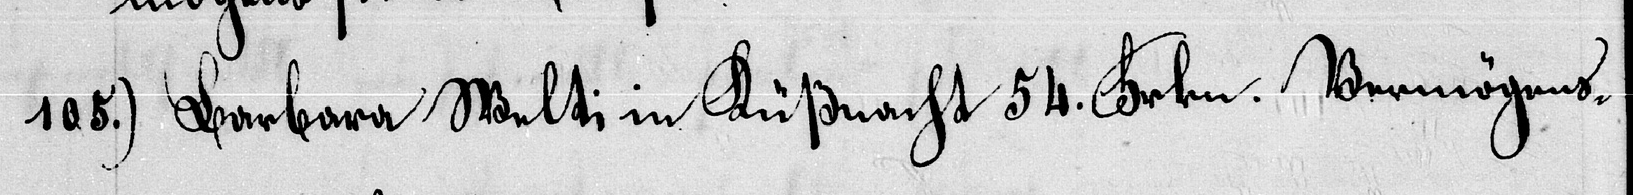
105.) Barbara Welti in Küßnacht 54. Frkn. Vermögens¬
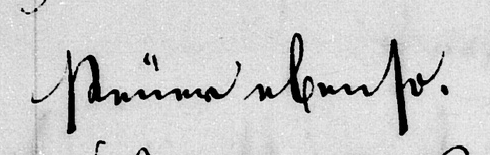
steuer ebenso.
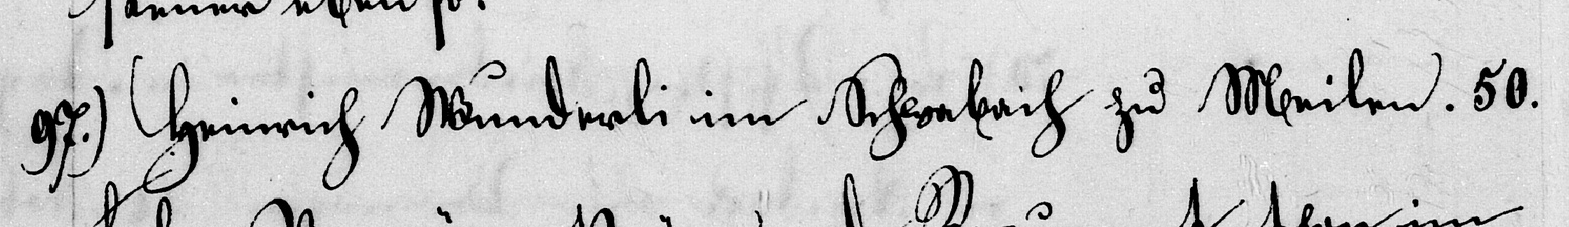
97.) Heinrich Wunderli im Schwabach zu Meilen. 50.
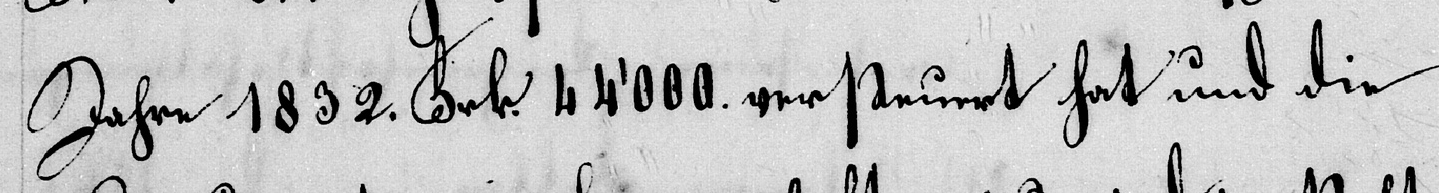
Jahre 1832. Frk. 44'000 versteuert hat und die
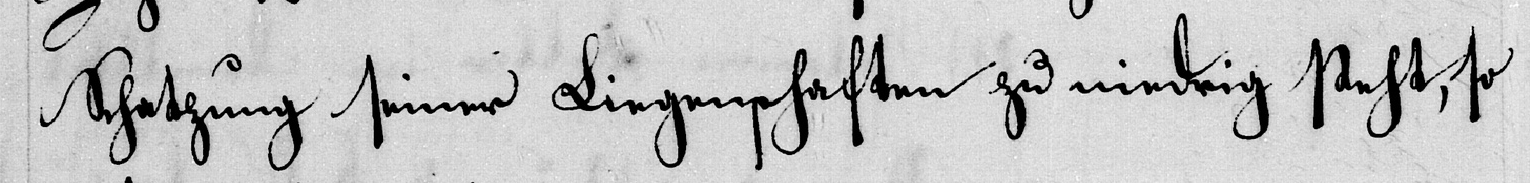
Schatzung seiner Liegenschaften zu niedrig steht, so
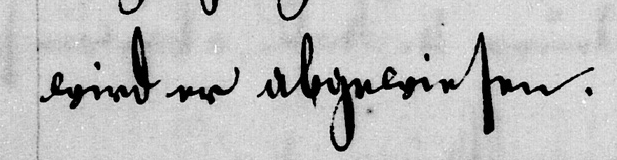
wird er abgewiesen.
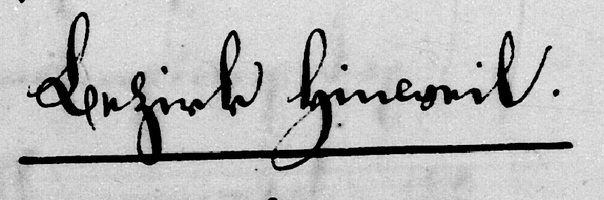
Bezirk Hinweil.
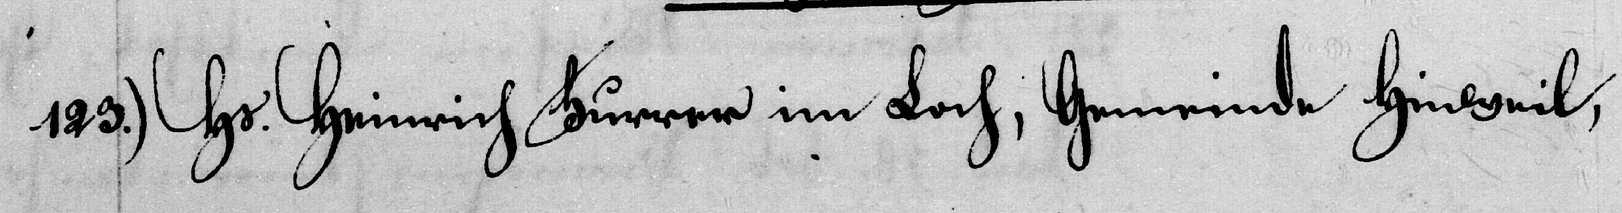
123.) Hs. Heinrich Furrer im Loch, Gemeinde Hinweil,
